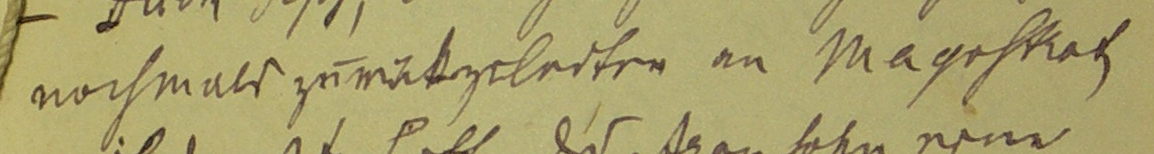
nochmals zurückzuleiten an Magistrat,
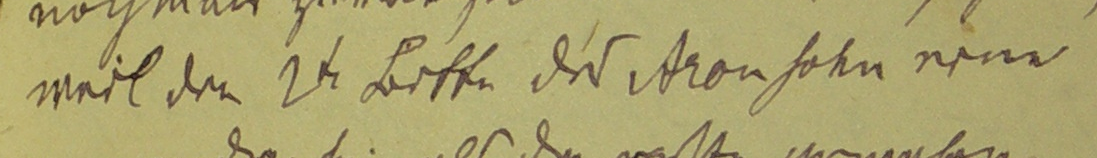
weil die 2- ten Bitte des Aronsohn eine
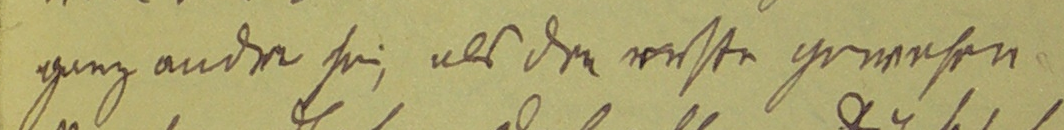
ganz andere sei, als die erste gewesen.
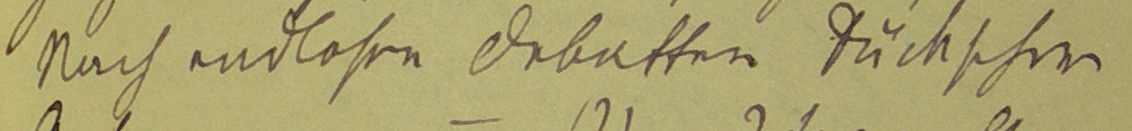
Nach endlosen Debatten Dückscher
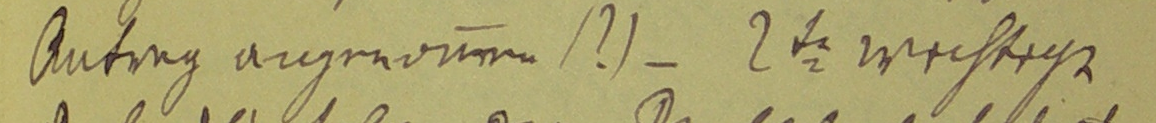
Antrag angenommen ( ? ) . 2-te wichtige
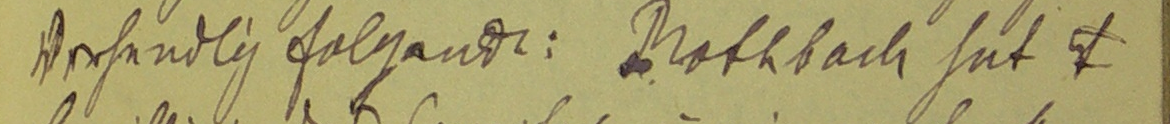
Verhandlung folgende: Rothbach hat mit
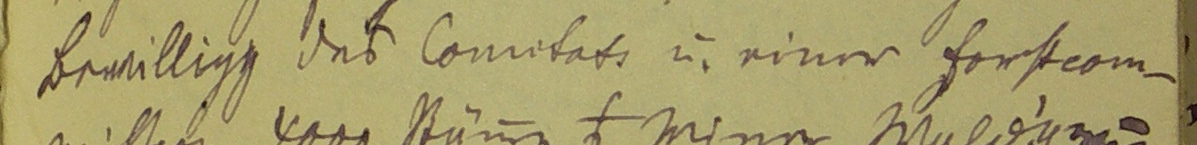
Bewilligung des Comitats und einer Forstcom¬
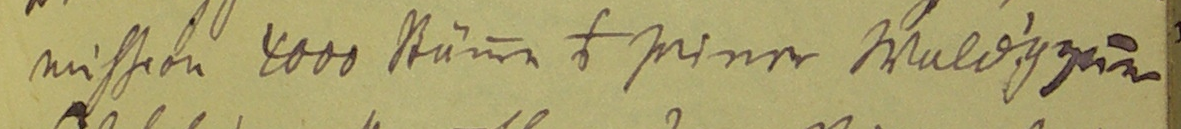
mision 4000 Stämme aus seim Waldung zum
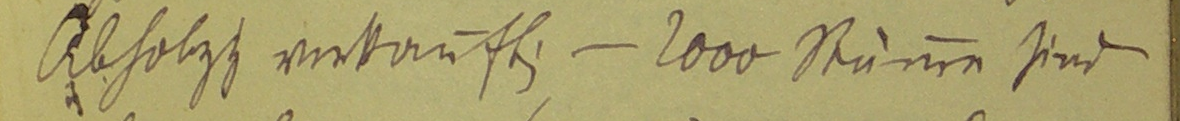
Abholzz verkauft. 2000 Stämme sind
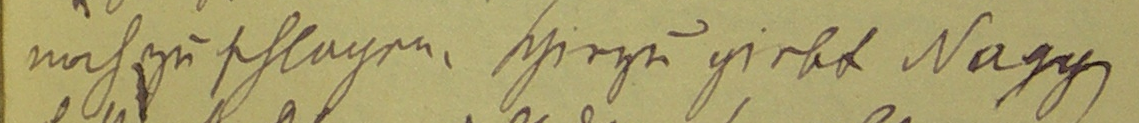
noch zu schlagen. Hinzu gibt Nagy,
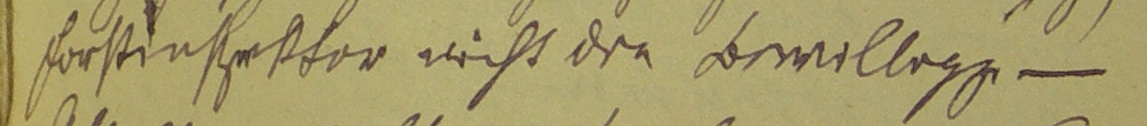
Forstinspektion nicht die Bewilligung—
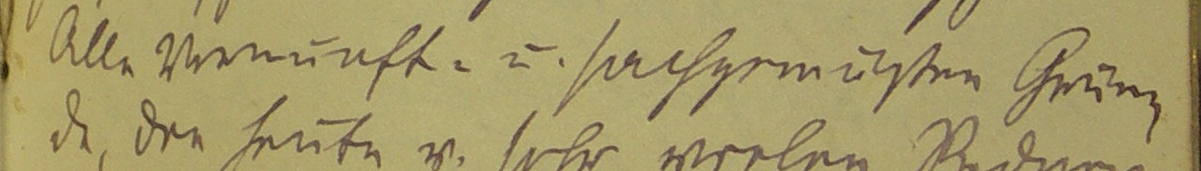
Alle Versuche und sachgemäßen Grün¬
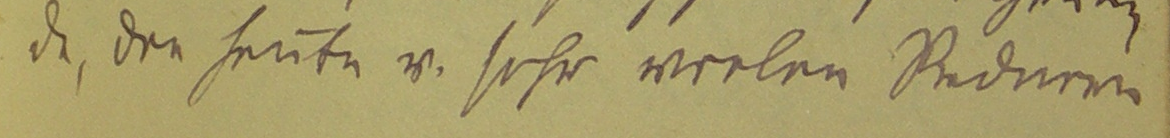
de, die heute von sehr vielen Redner
